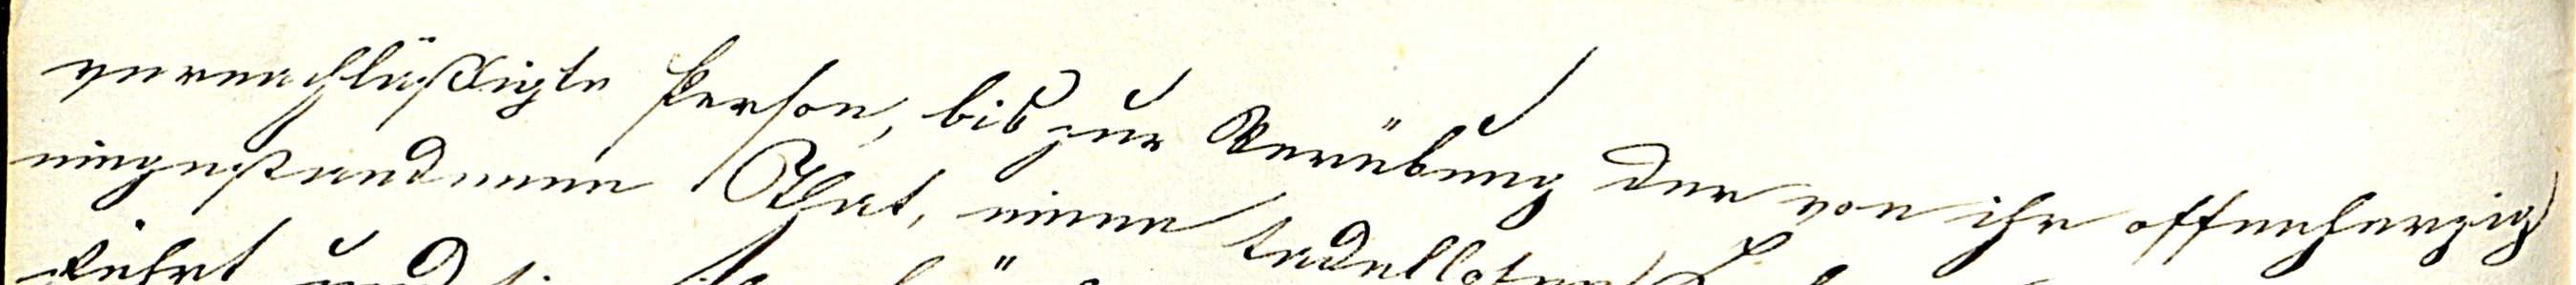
vernachläßigte Person, bis zur Verübung der von ihr offenherzig
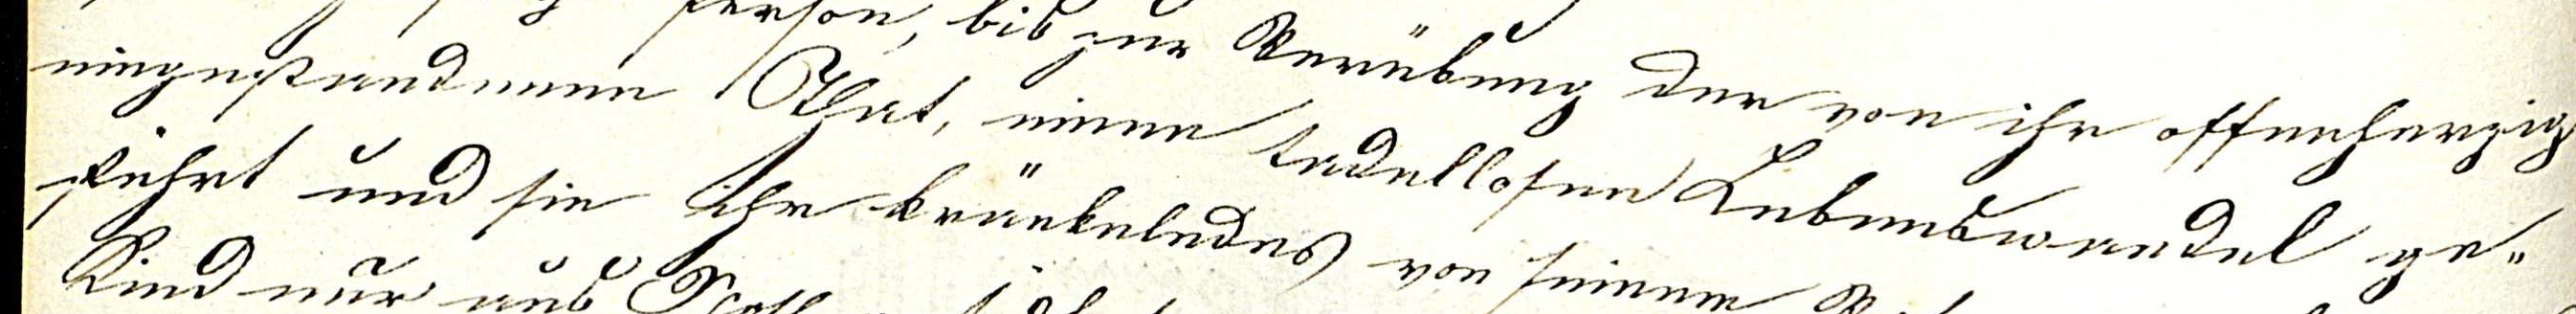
eingestandenen That, einen tadellosen Lebenswandel ge¬
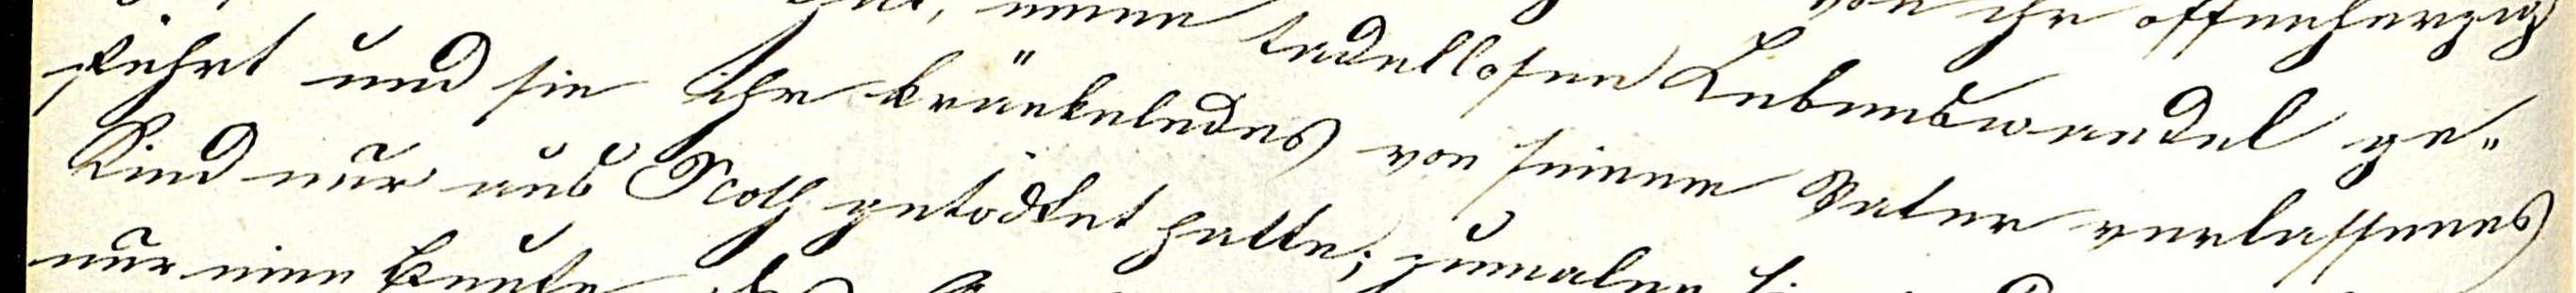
führt und sie ihr kränkelndes von seinem Vater verlassenes
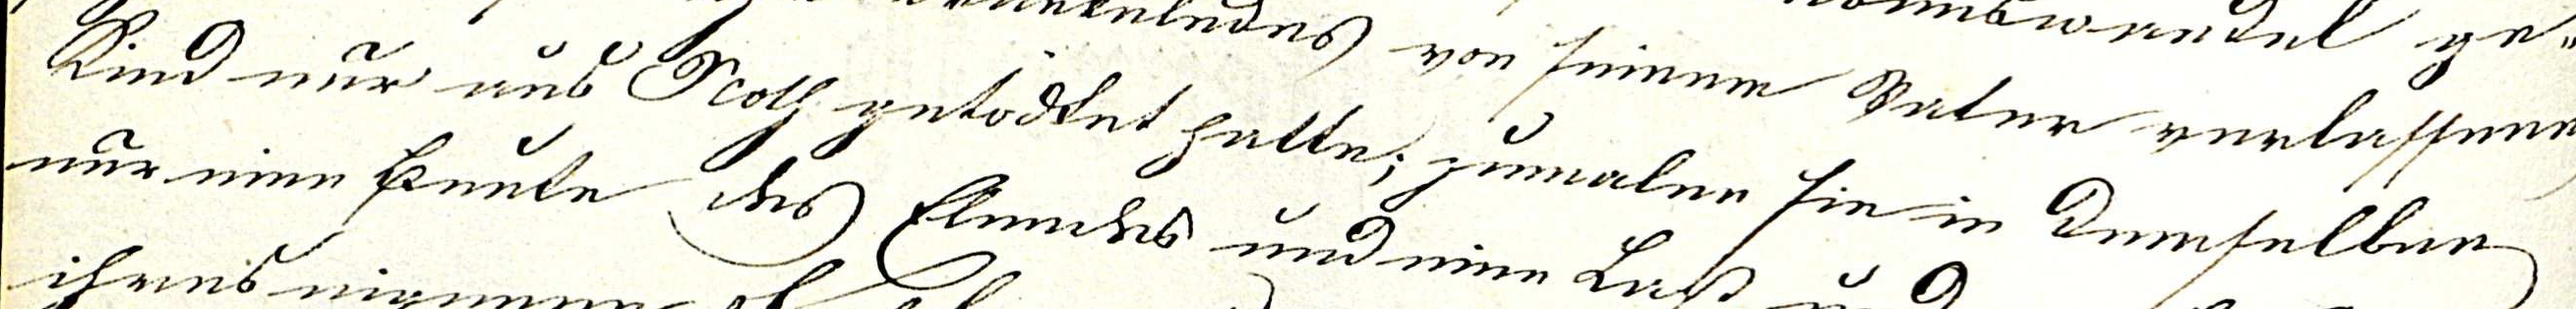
Kind nur aus Noth getödtet hatte; zumalen sie in emselben
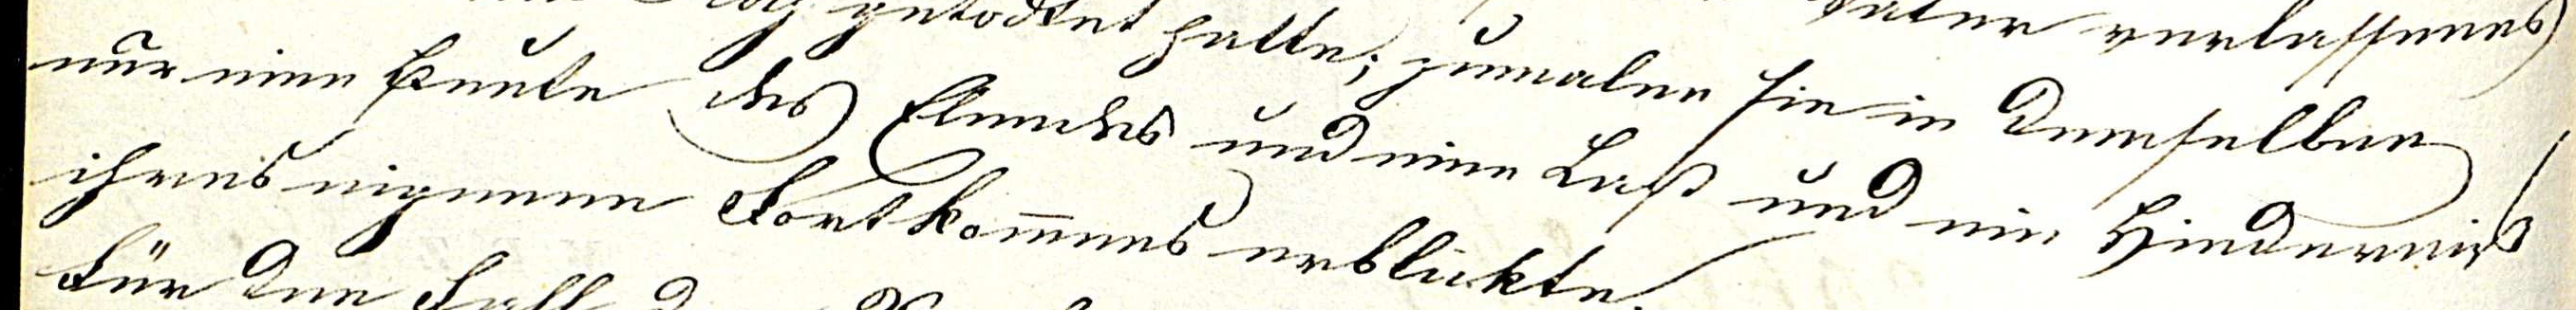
nur eine Beute des Elendes und eine Last und ein Hindernis
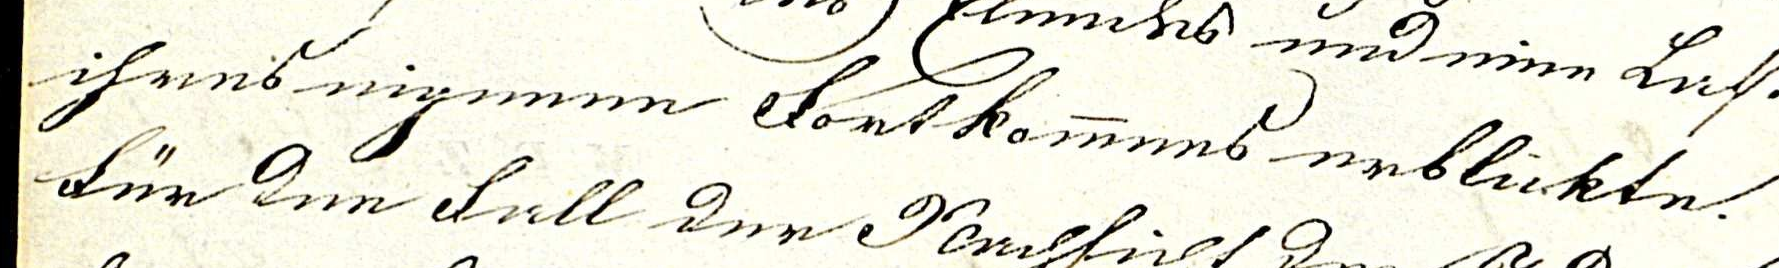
ihres eigenen Fortkommens erblickte.
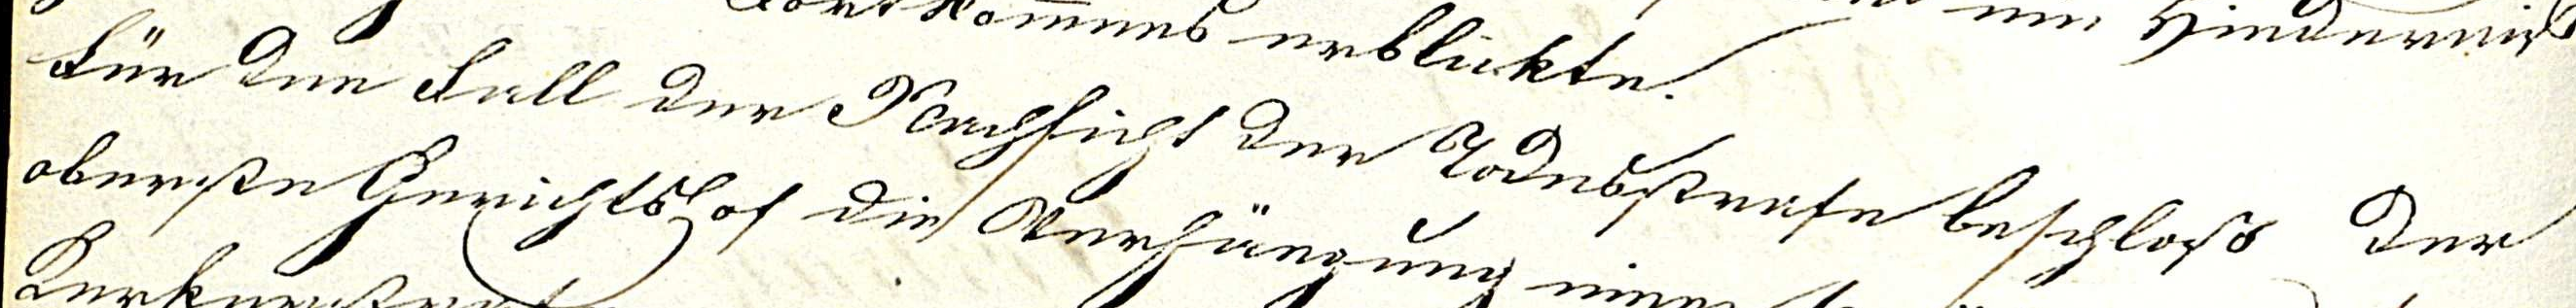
Für den Fall der Nachsicht der Todesstrafe beschloß der
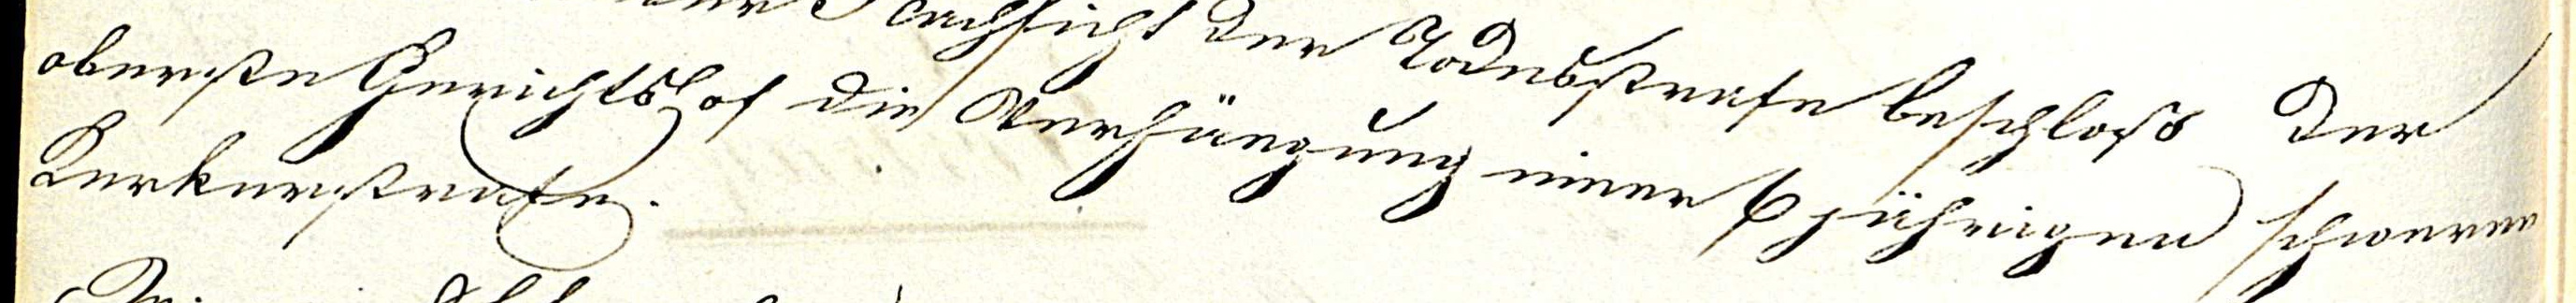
oberste Gerichtshof die Verhängung einer 6jährigen schweren
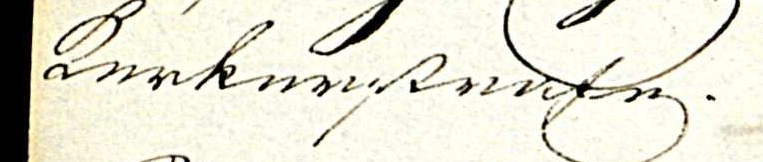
Kerkerstrafe.
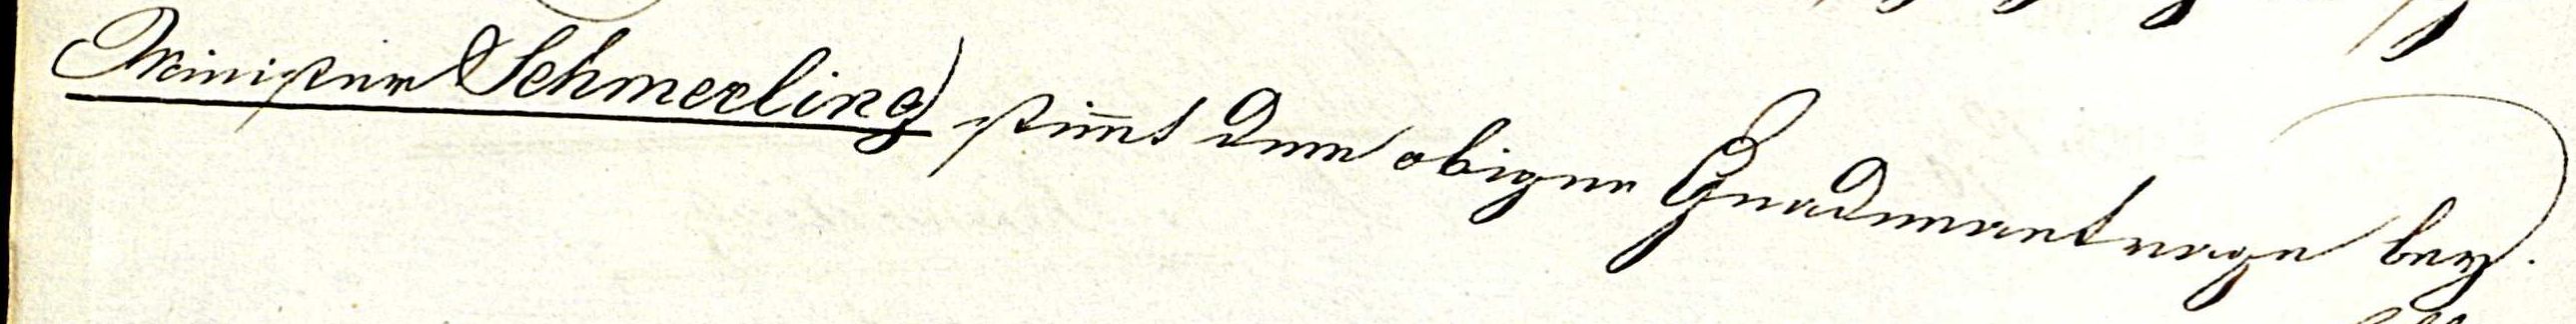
Minister Schmerling stimmt dem obigen Gnadenantrage bey.
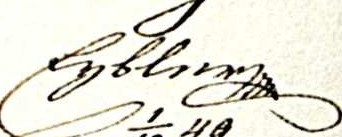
Eybler
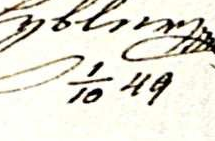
1/10 49
